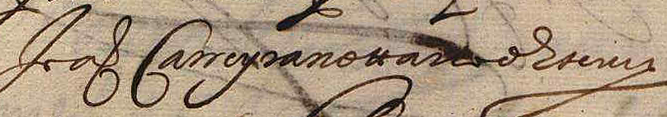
Joaõ Carreyra nottario o Escreuj
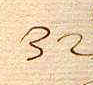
32
